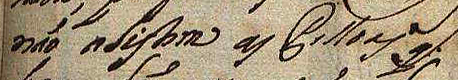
naõ asistem as Pessoas q.
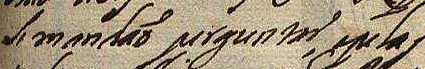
se mandaõ perguntar, e pelas
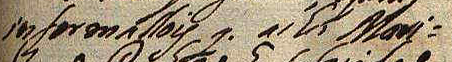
informassois q. acho Mari
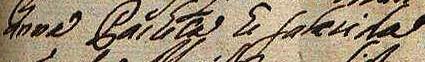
anna Pacheca he falecida
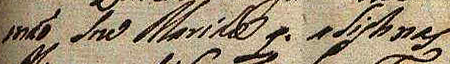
e naõ seu Marido q. asiste nas
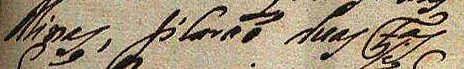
Minas, fiCaraõ duas Fa.s
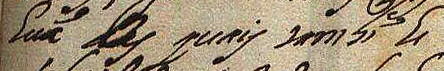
huā das quais tambē he
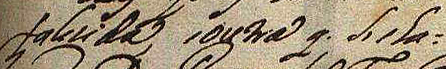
falecida, e outra q. se cha
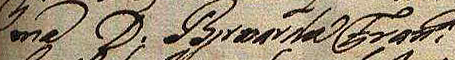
ma D. Bernarda Fran.ca
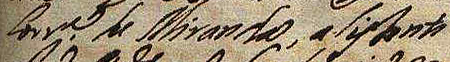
Corra. de Miranda, asistente
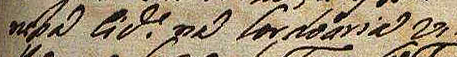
nesta Cid.e na Cordoaria ve
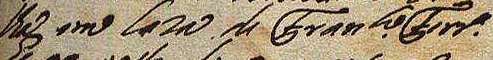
lha em Caza de Fran.co Ferr.a
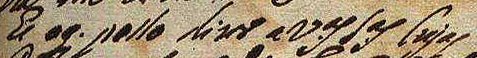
he o q̄ posso dizer a V.as S.as Cujas
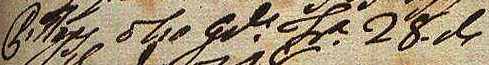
Pessoas o Ceo gd.e Lr.a 28. de
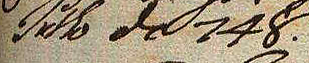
Iulho de 748.
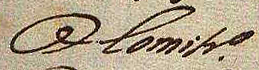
O Comisr.o
